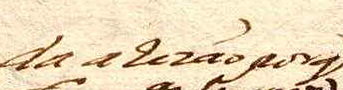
da a Rezão porq̄
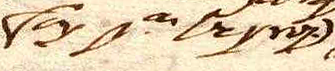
foy p.a Veyros.
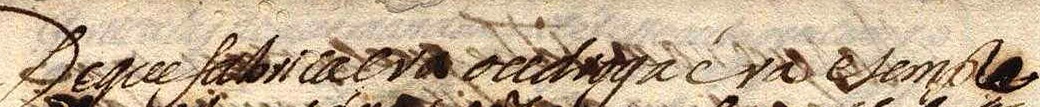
De que fabrica era ou droga era e sempre
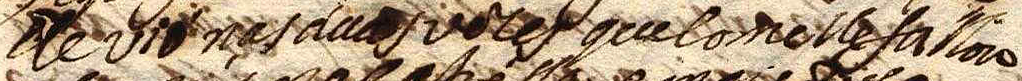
lhe vio nas duas vezes que com elle fallou
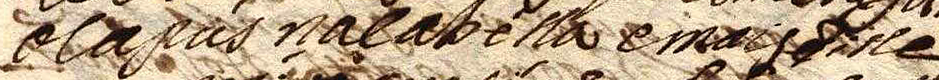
o capús na cabessa e mais disse
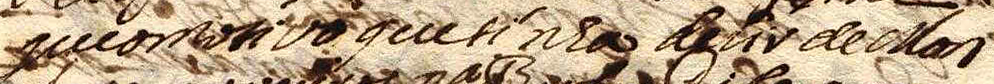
que o motivo que tinha de hir de Mon
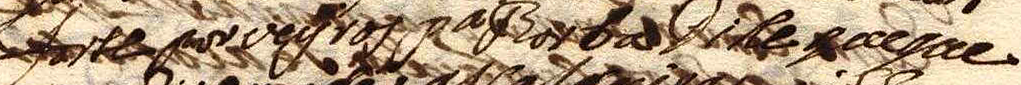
forte por veyros pa Borba Disse que que
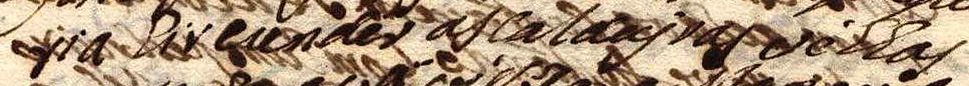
ria hir eunder as caldeyras velhas
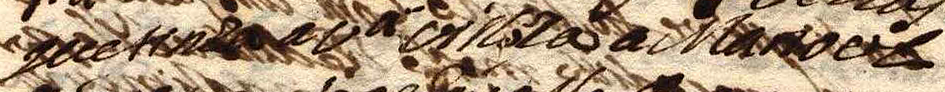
que tinha a v.a vissoza a ManoeL
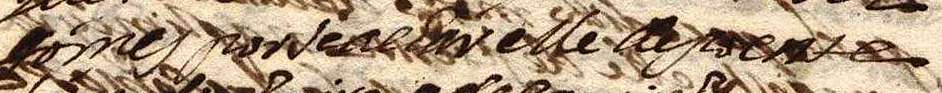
gomes por se achar elle depoente
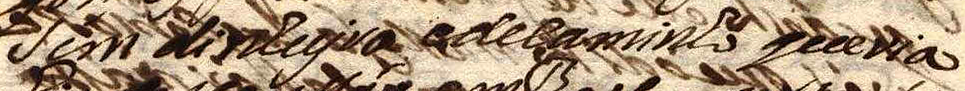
sem dinheyro e de caminho queria
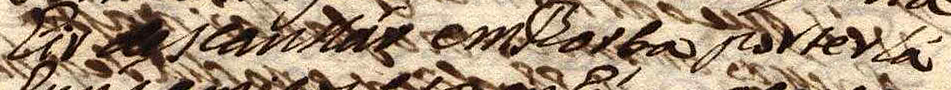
hir descanssar em Borba por ter lá
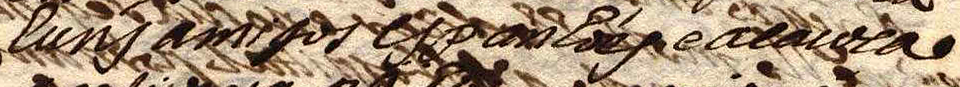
huns amigos espanhoés e a cauza
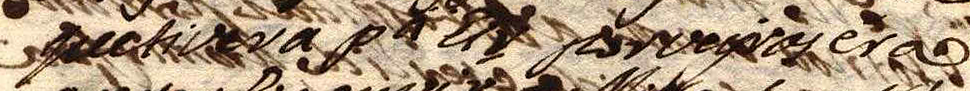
que tivera pa hir, por veyros era
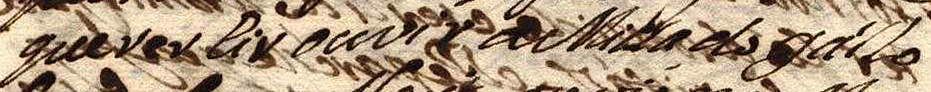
querer hir ouvir a Missa do gallo
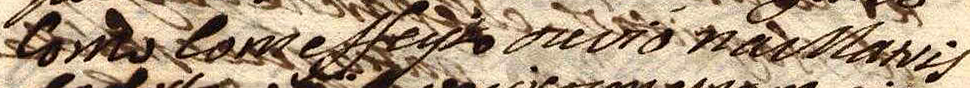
Como com effeyto ouvio na Matris
